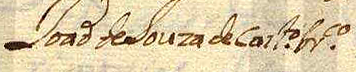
Ioaõ de Souza de Cast.obr.co
